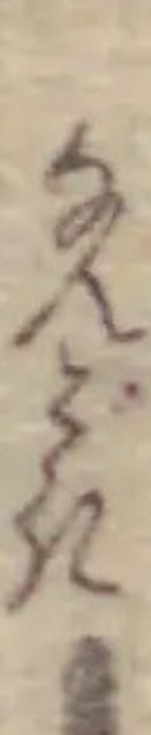なんどき

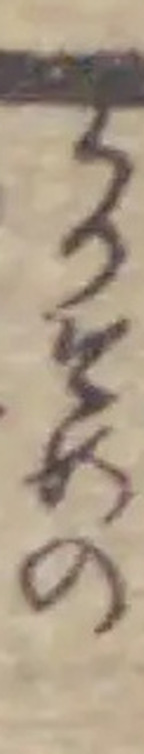かりそめの
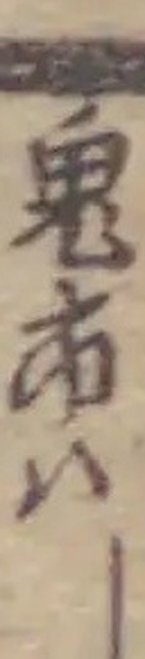鬼市は
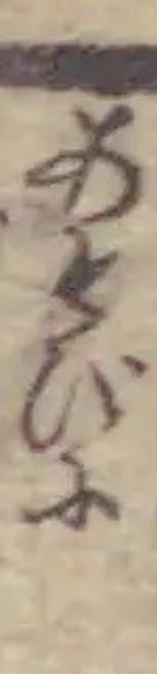あそびに
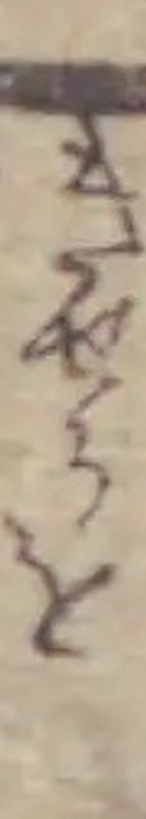きせうを
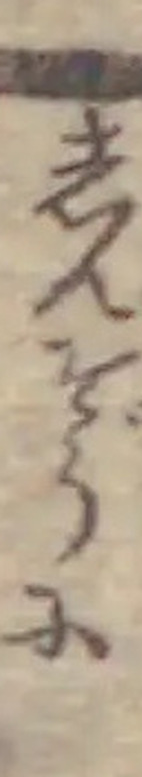しんぞうに
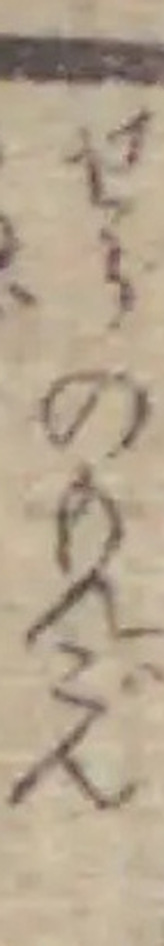せうのもんごん
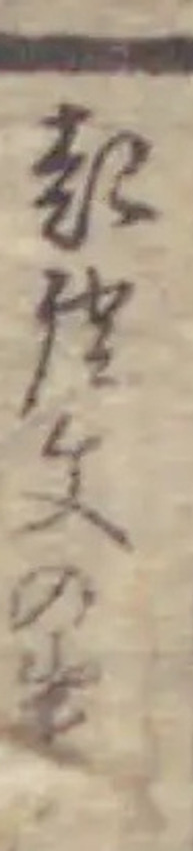起請文の事
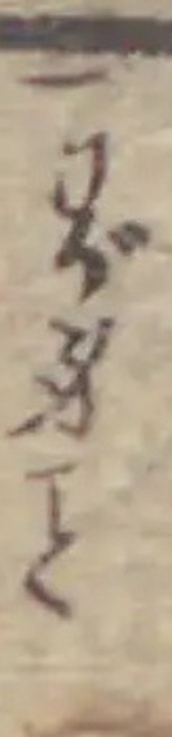わが身こと
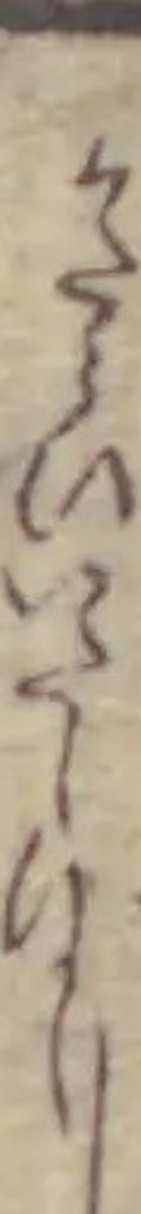かたらひいたし候し
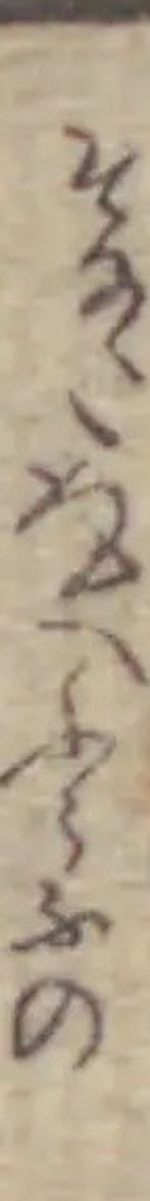そなた様へふうふの
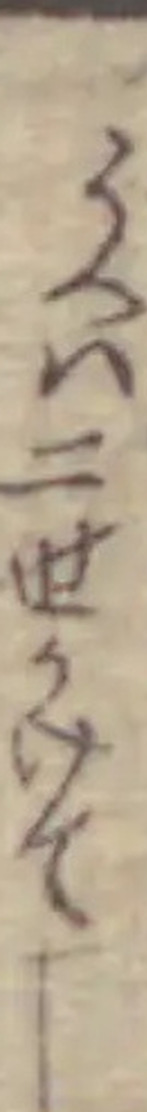うへは二世かけて
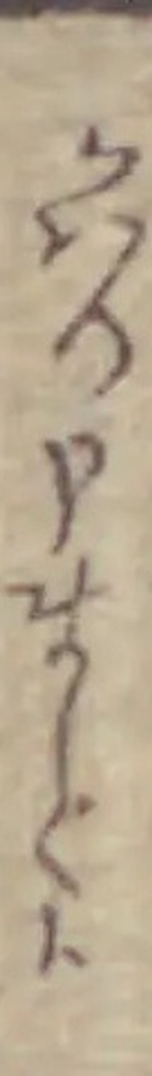かはり申ましく候
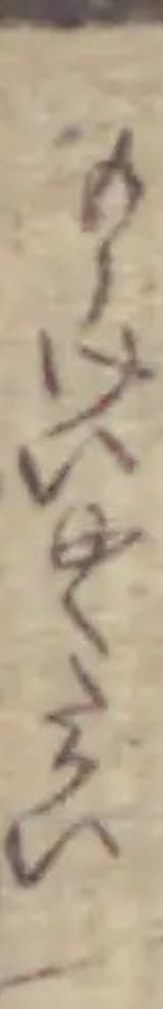もしけいやくたかい
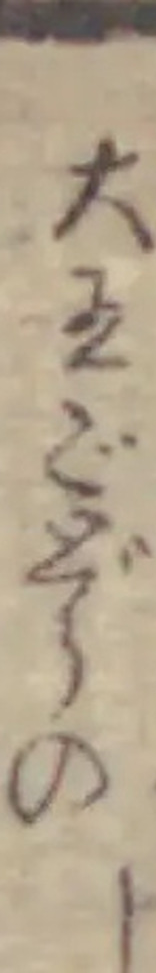大王ごどうの
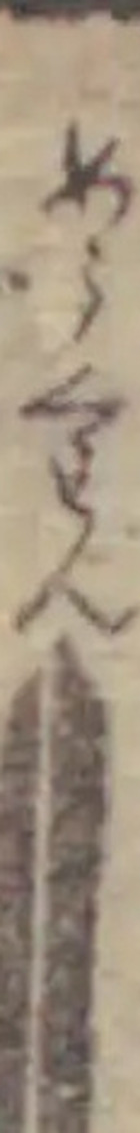めうくわん
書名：鬼子宝 3巻
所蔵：国立国会図書館 National Diet Library, JAPAN
